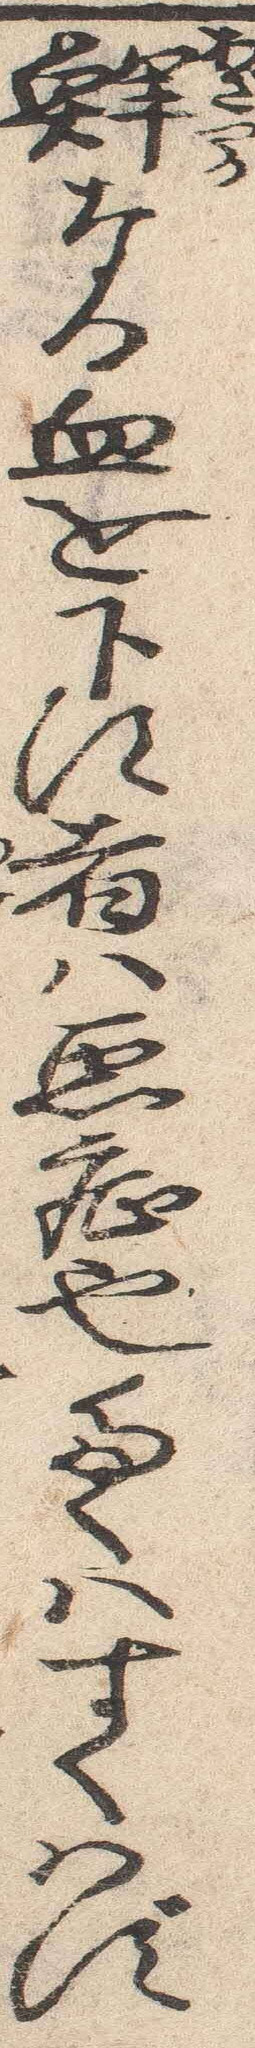鮮なる血を下す者は悪症也多くはすくはず
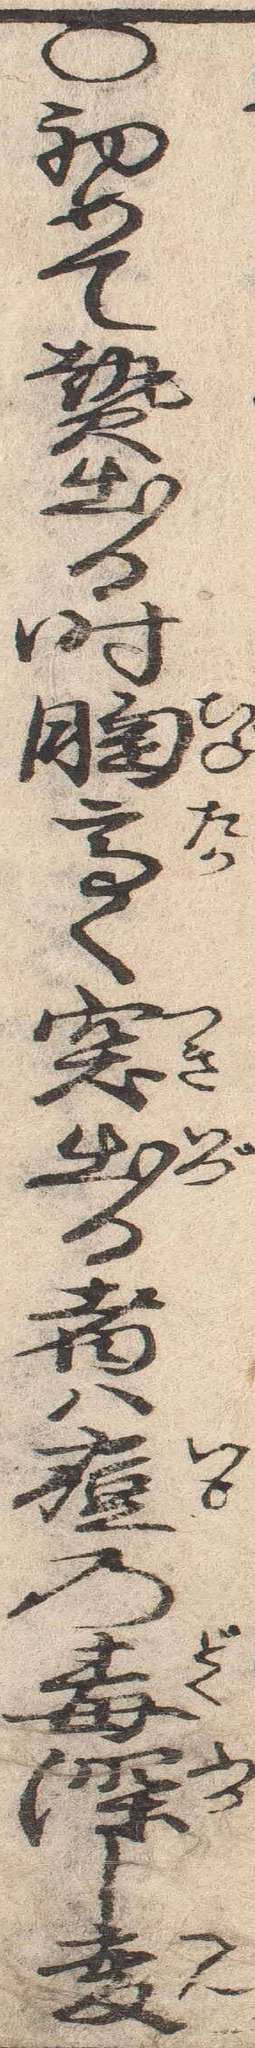○初めて熱出る時胸高く突出る者は痘の毒深し変
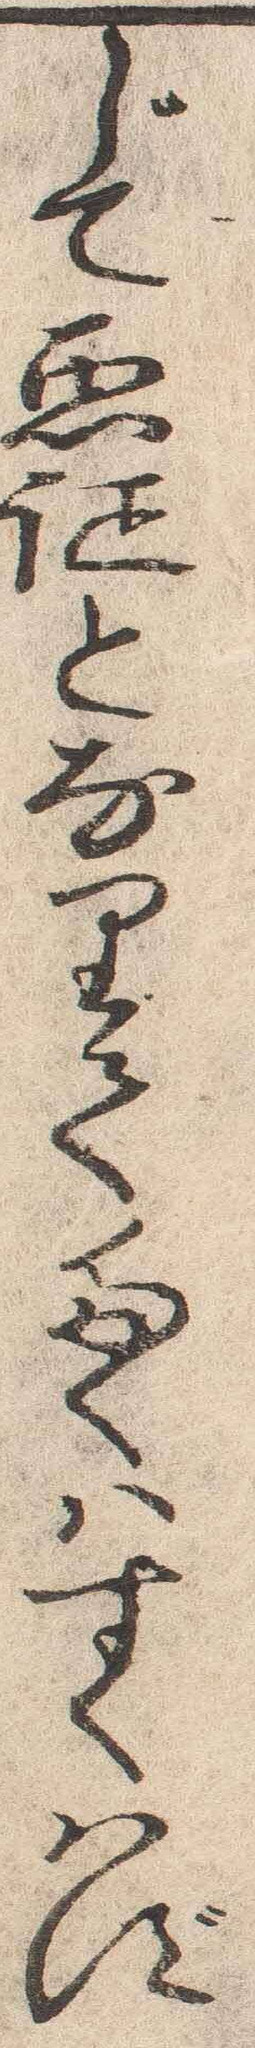じて悪証となりて多くはすくはず
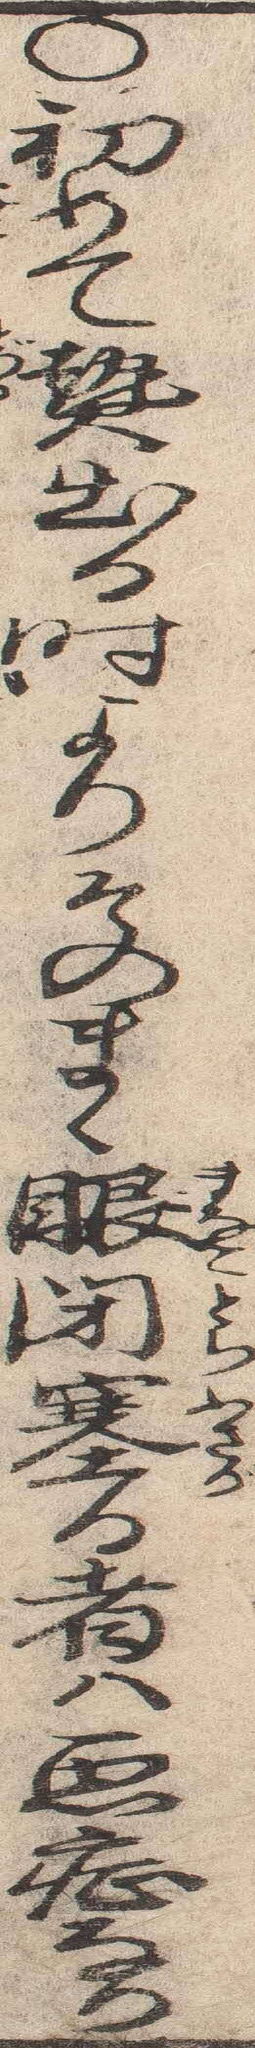○初めて熱出る時よりそのまゝ眼閉塞る者は悪症なり

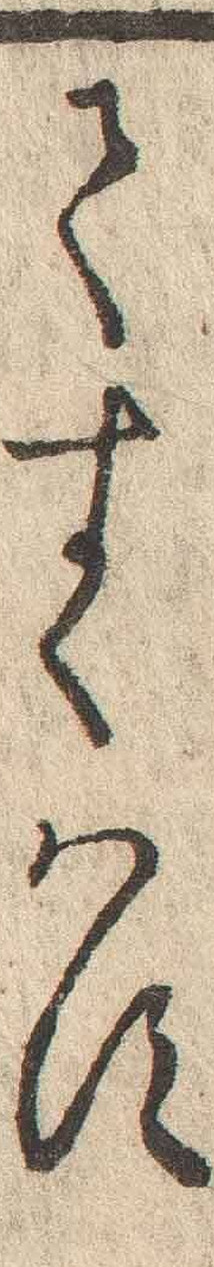てすくはす
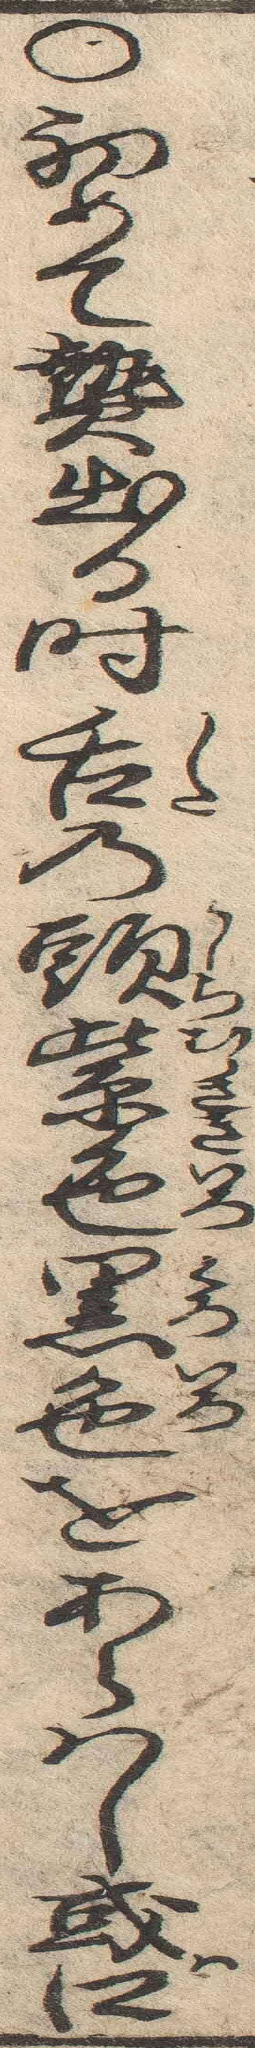○初めて熱出る時舌の頭紫色黒色をあらはし或は口
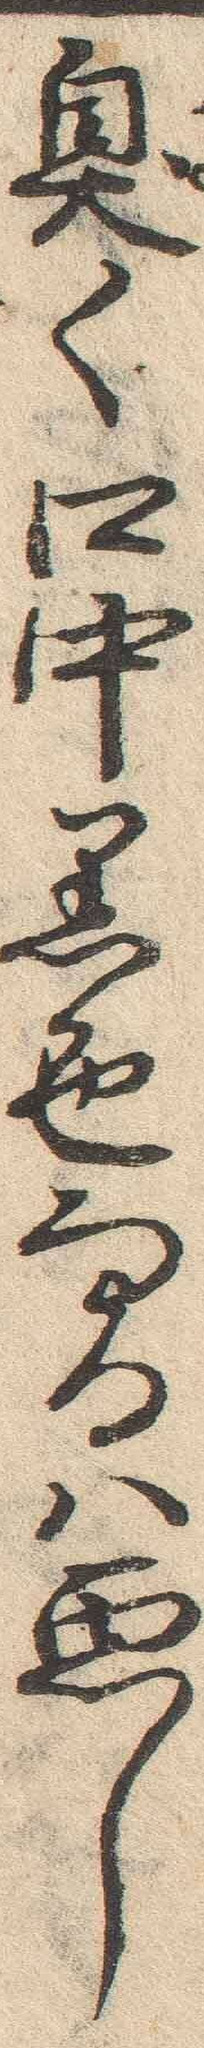臭く口中黒色なるは悪し
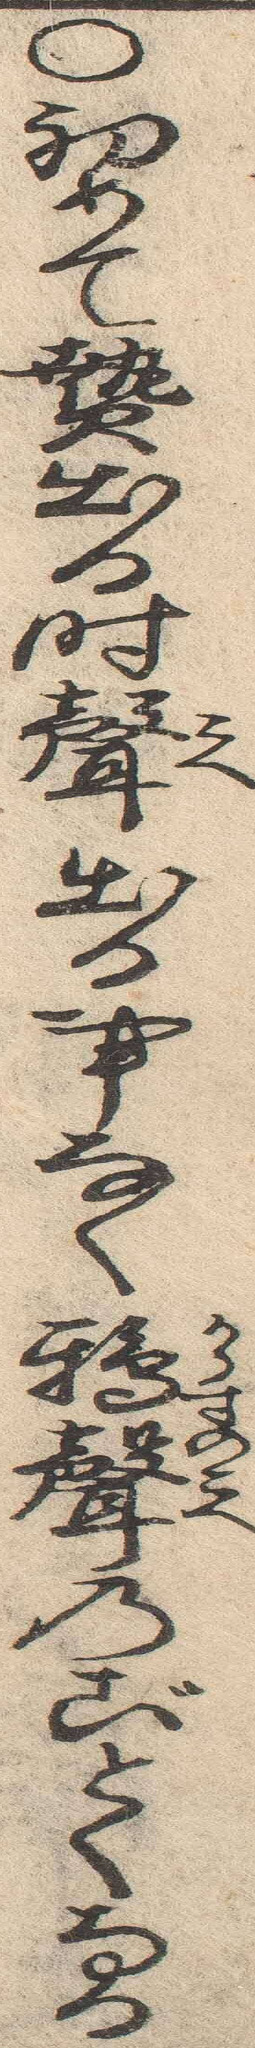○初めて熱出る時声出る事なく鴉声のごとくなる
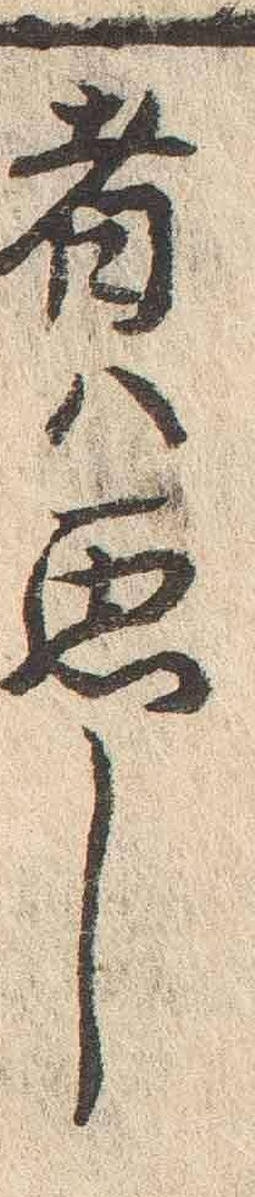者は悪し
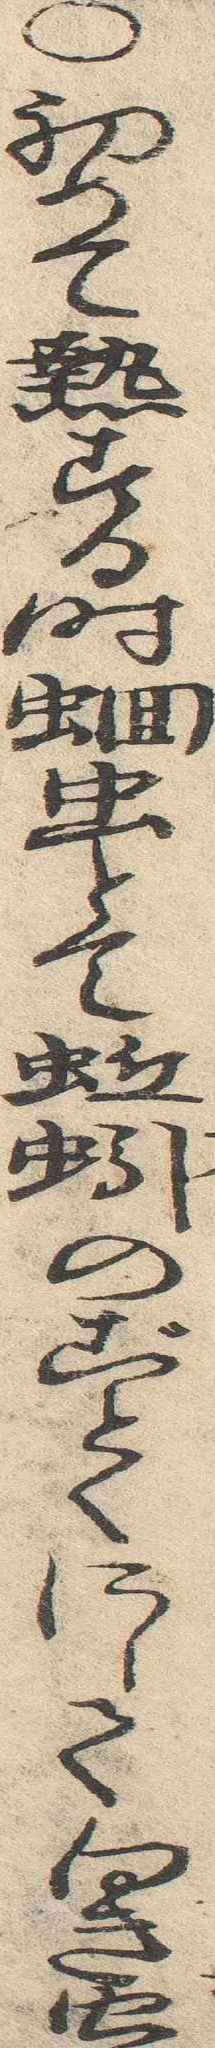○初めて熱する時蛔虫とて蚯蚓のごとくにして白き虫
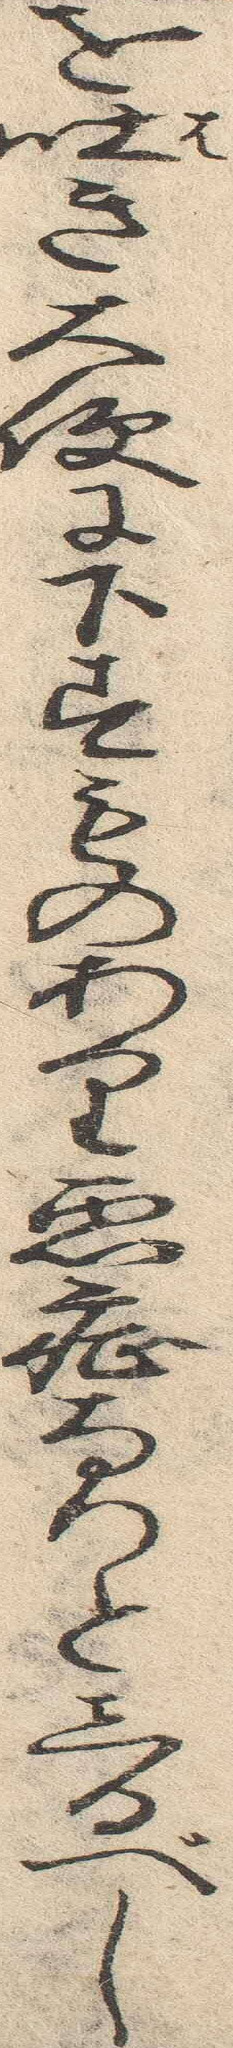を吐き大便に下すものあり悪症なりとしるべし
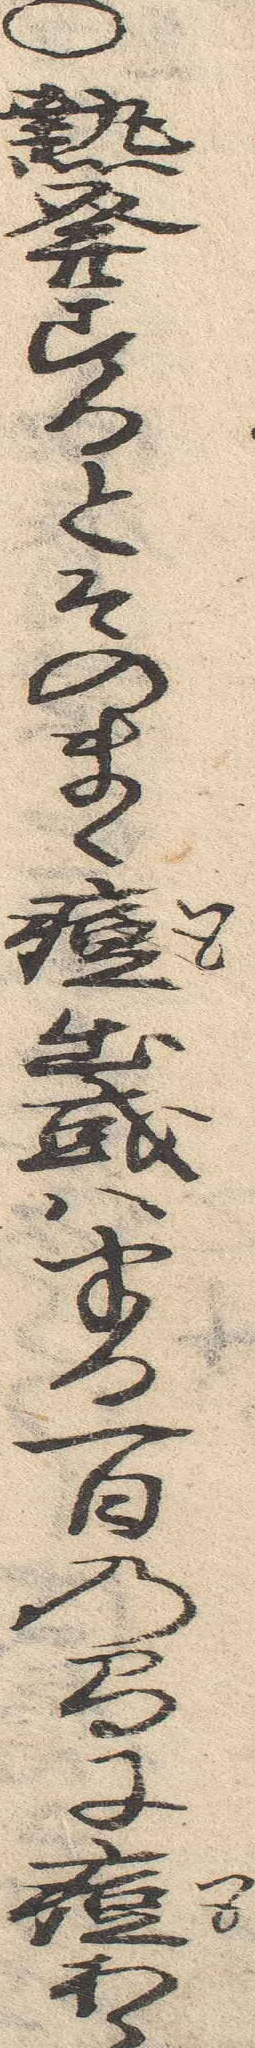○熱発するとそのまゝ痘出或は半か一日の間に痘あら
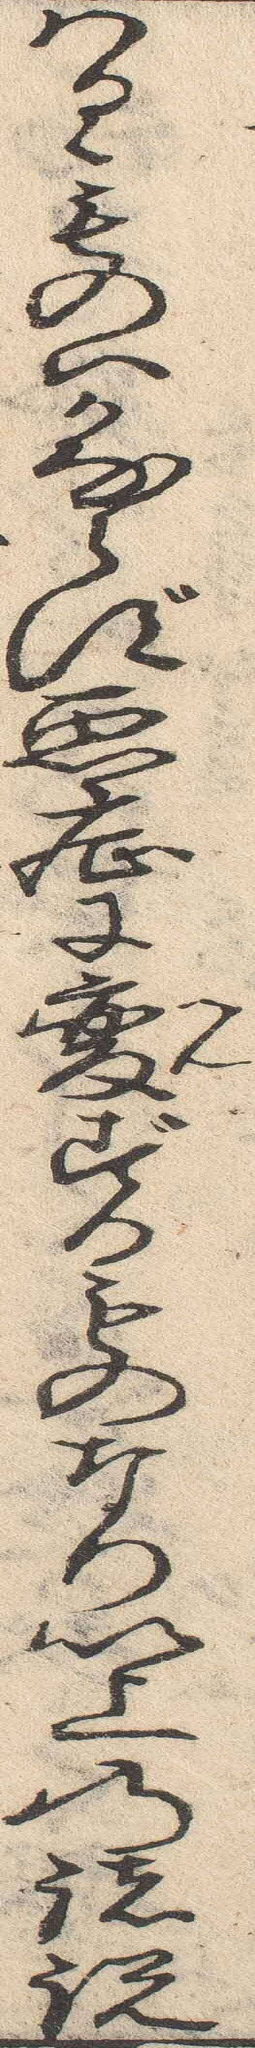はるゝものはかならず悪症に変ずるものなり以上の諸説
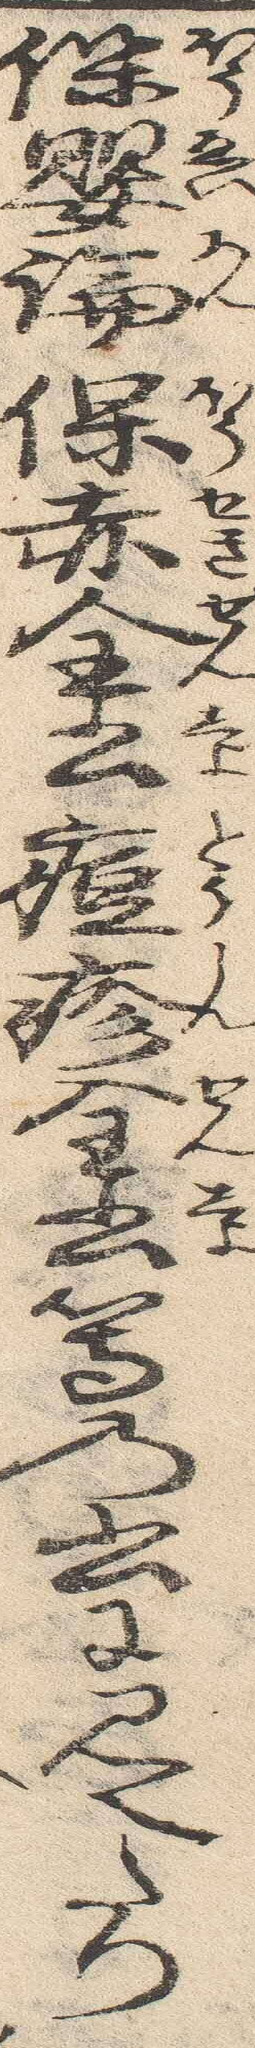保嬰論保赤全書痘疹全書等の書に見えたり
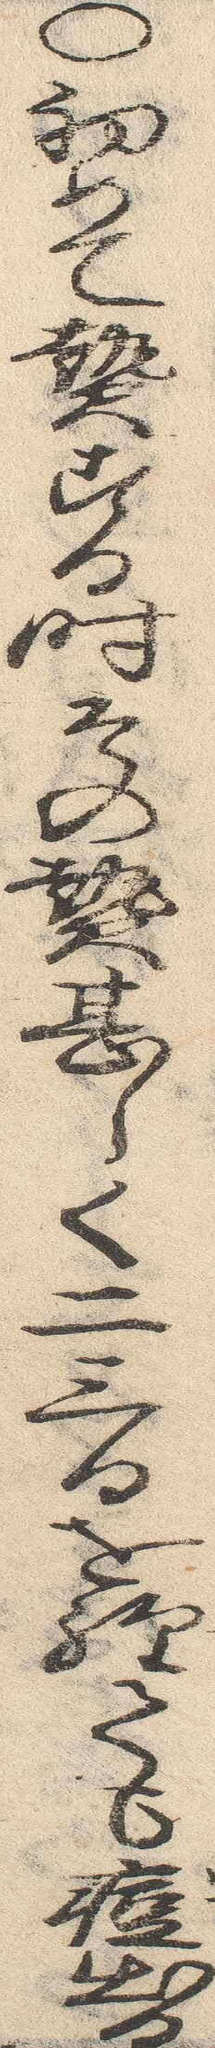○初めて熱する時その熱甚しく二三日を経ても痘出る
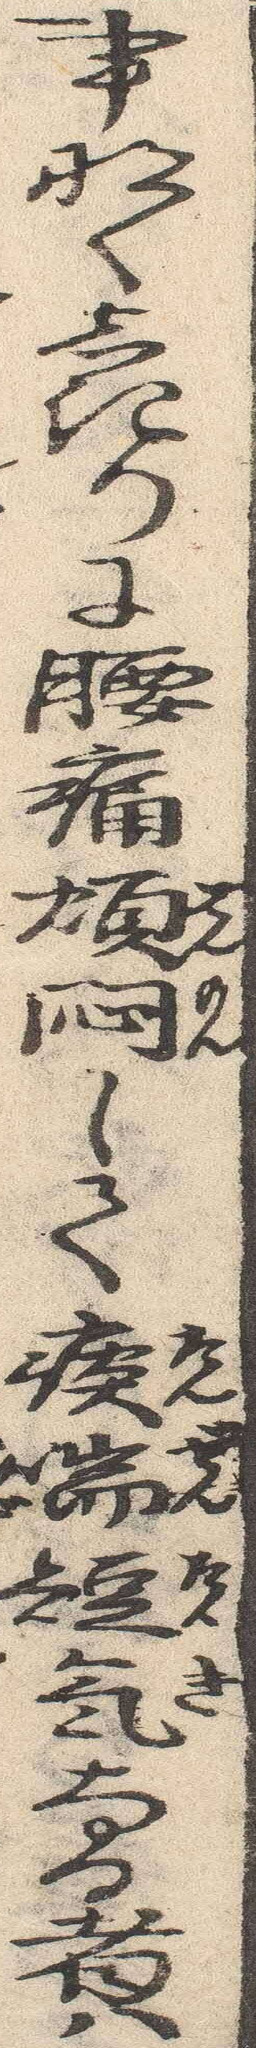事なくしきりに腰痛煩悶して痰喘短気なる者は
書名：小児必用養育草
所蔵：東京学芸大学附属図書館 国文学研究資料館
